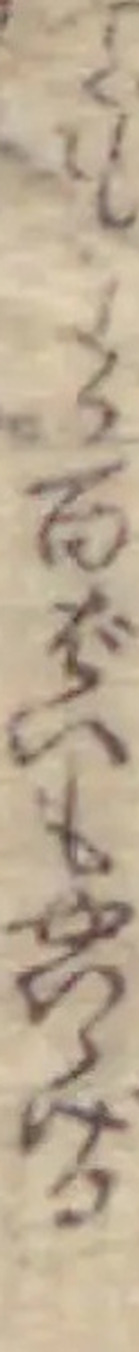いへどもわか百ばいもやはらげる
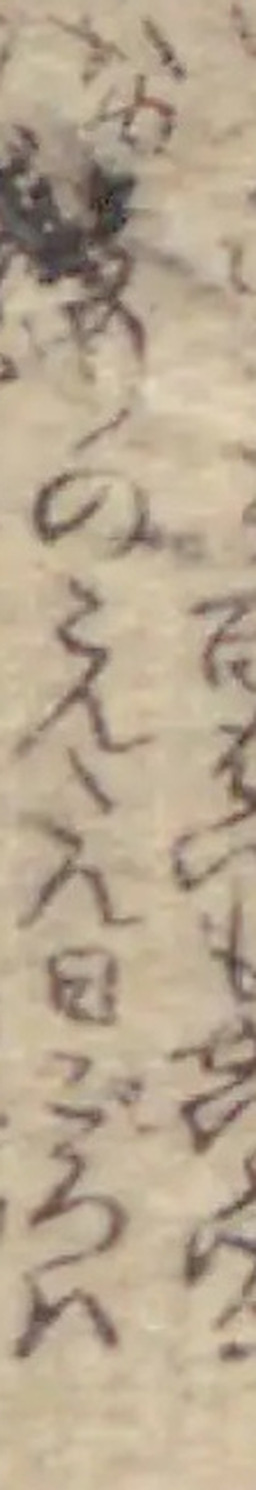はゆうりのこんたん日ごろは
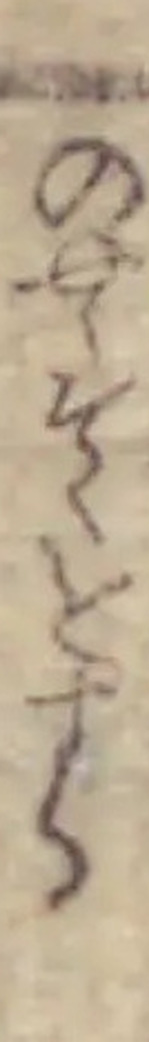のやくそくをする
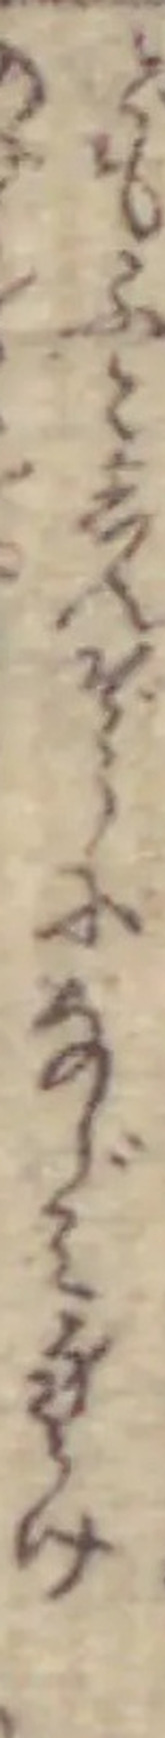どもふとしんぞうになじみ身うけ
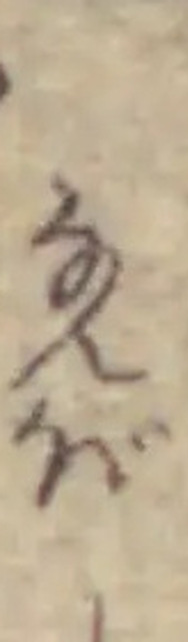なんぼ
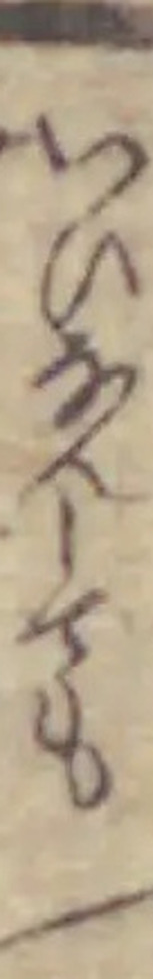いひなんしても
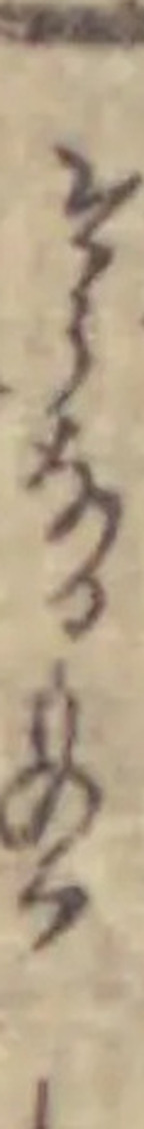そうなるものか
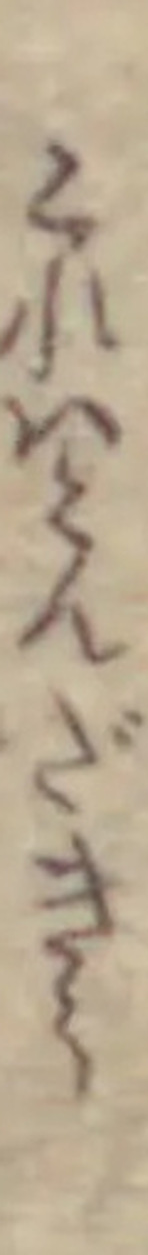これはとんだきう
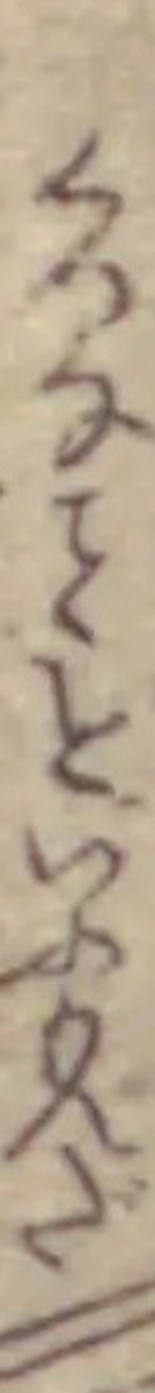くつなことをいふもんだ
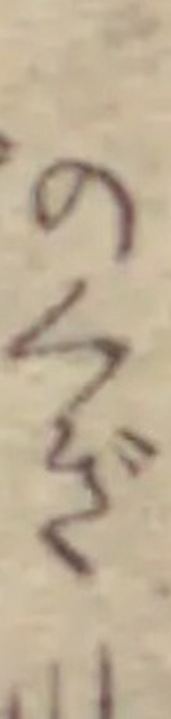のくぎ
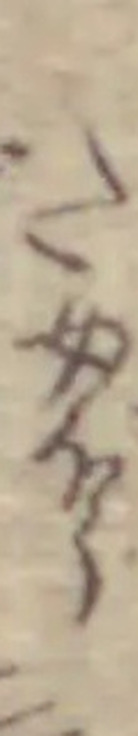た女ぼう
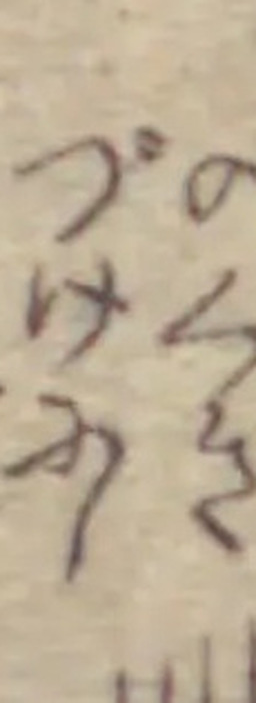づけにし
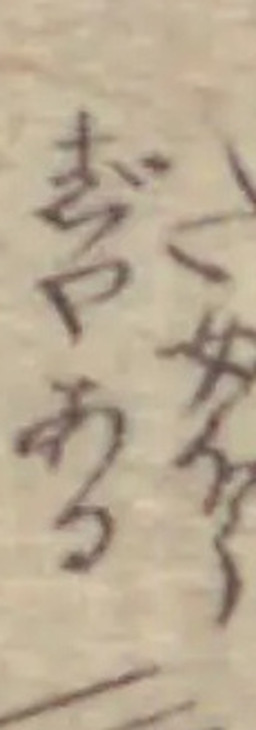じやある
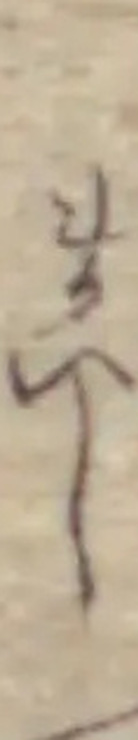まいし
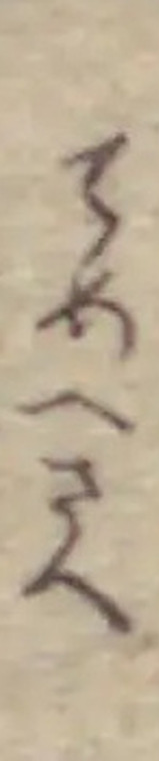てめへさへ
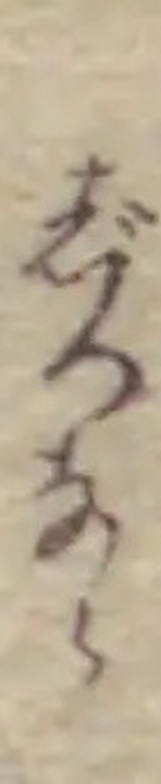じつなら
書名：鬼子宝 3巻
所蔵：国立国会図書館 National Diet Library, JAPAN
